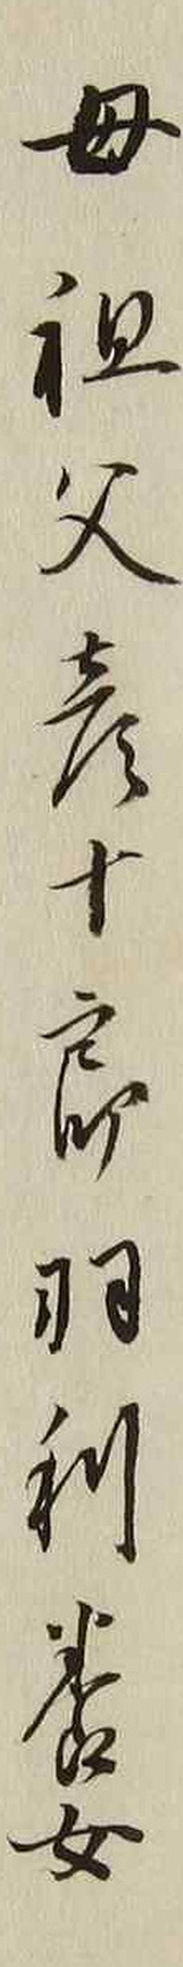母祖父彦十郎羽利養女
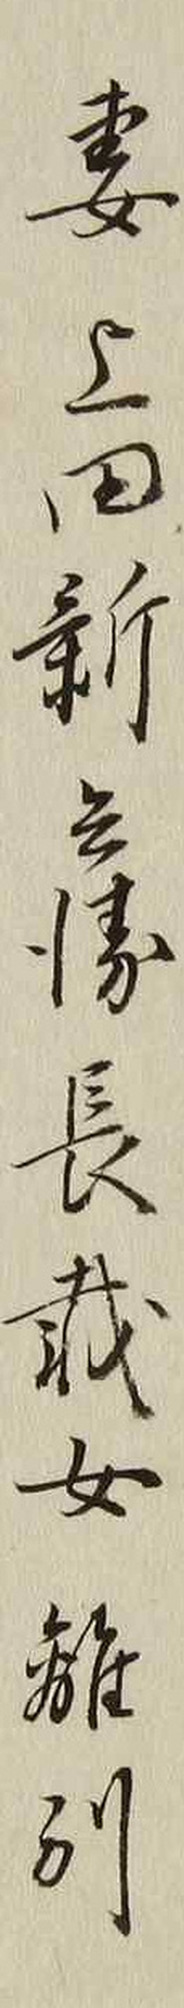妻上田新兵衛長載女離別
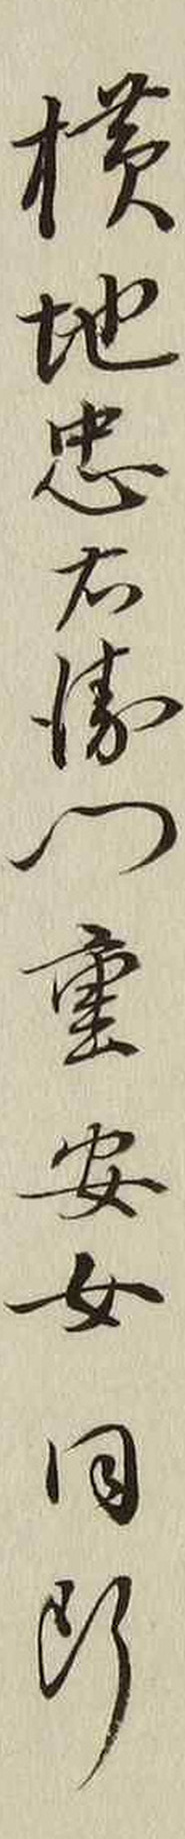横地忠右衛門重安女同断
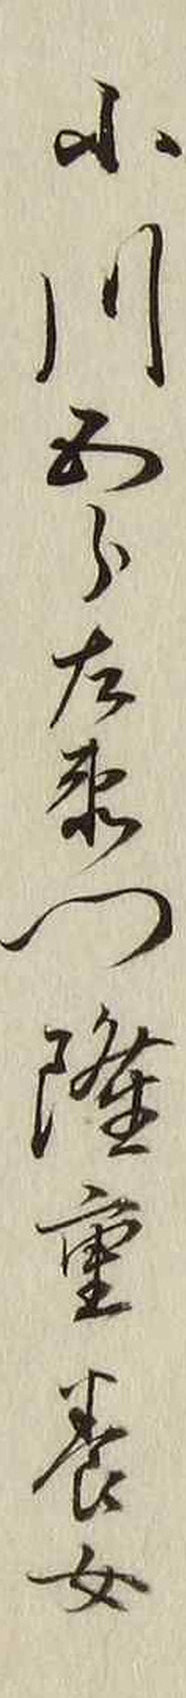小川五郎左衛門隆重養女
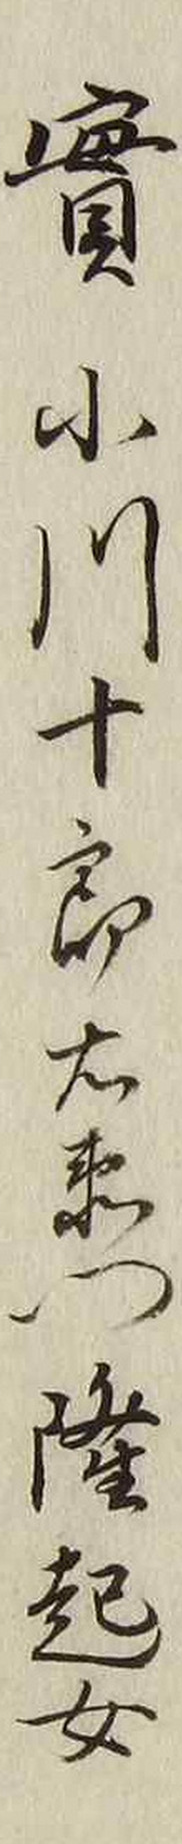実小川十郎右衛門隆起女
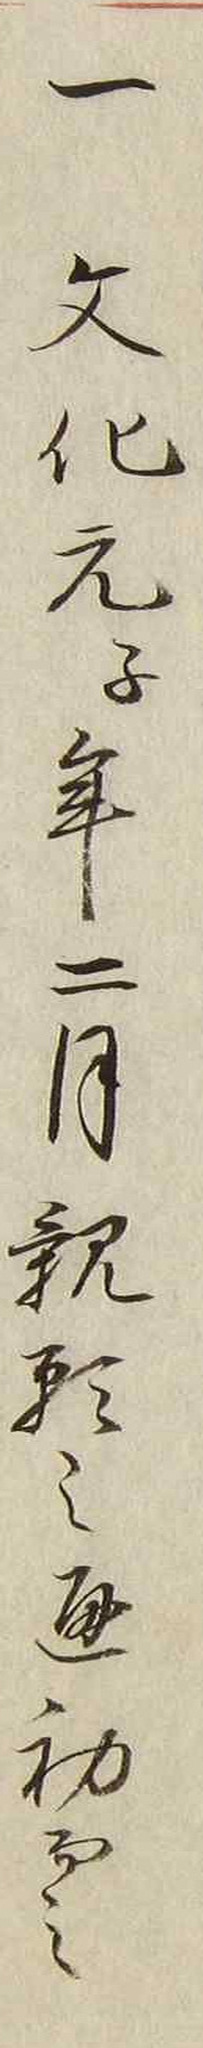一文化元子年二月親願之通初而之
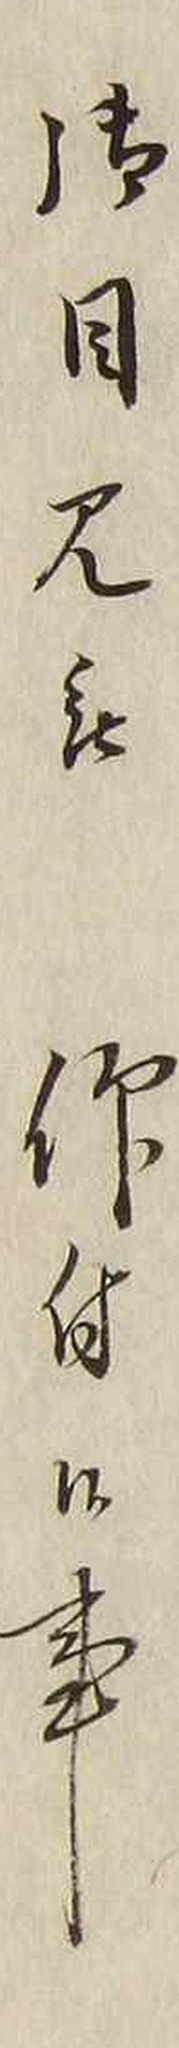御目見被仰付候事

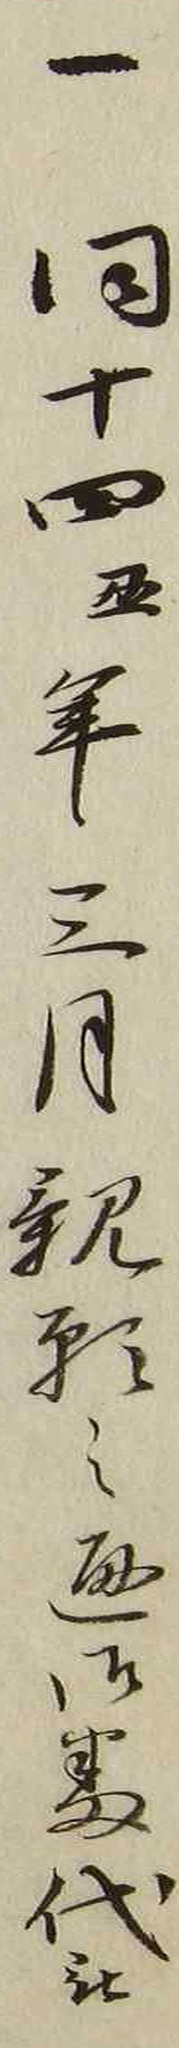一同十四丑年三月親願之通御番代被
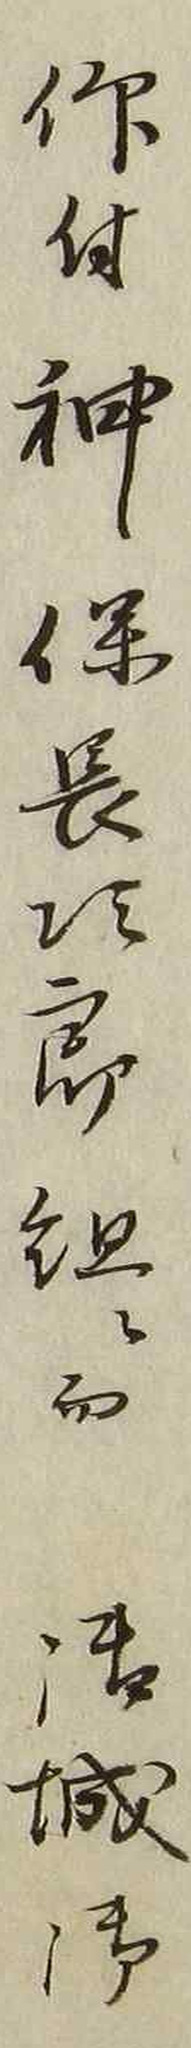仰付神保長次郎組ニ而御城御
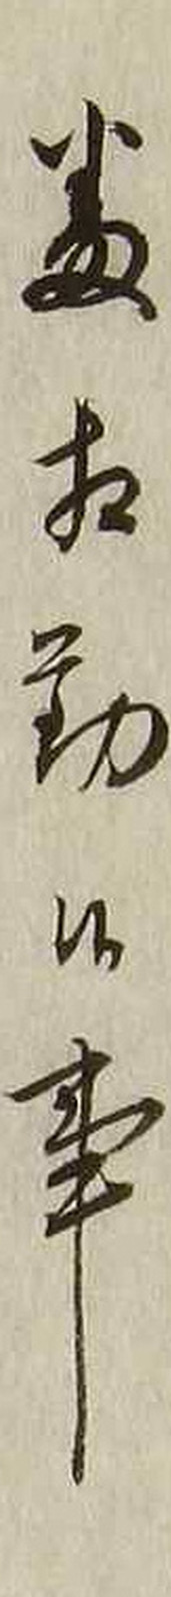番相勤候事
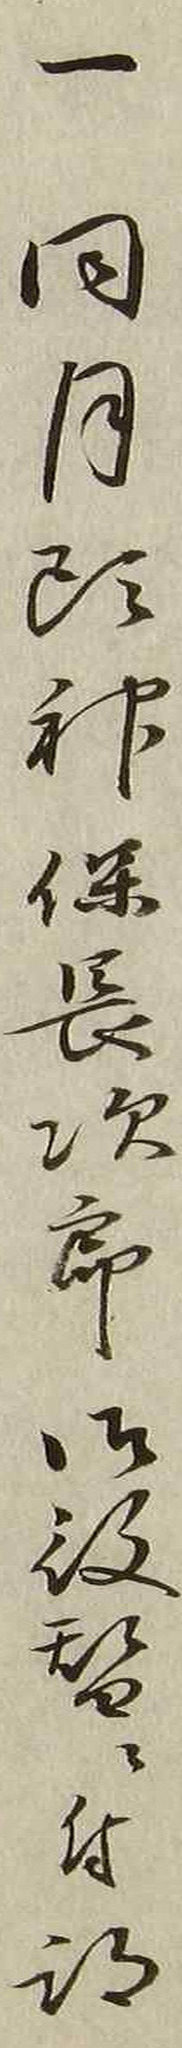一同月頭神保長次郎御役替ニ付跡
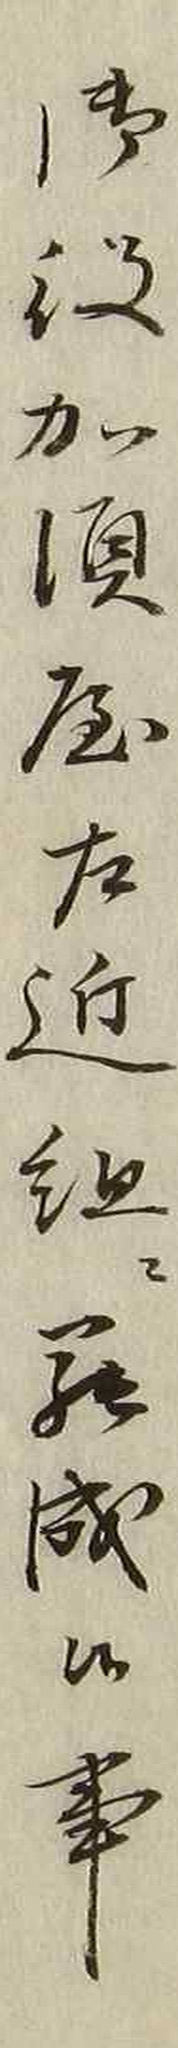御役加須屋左近組ニ罷成候事
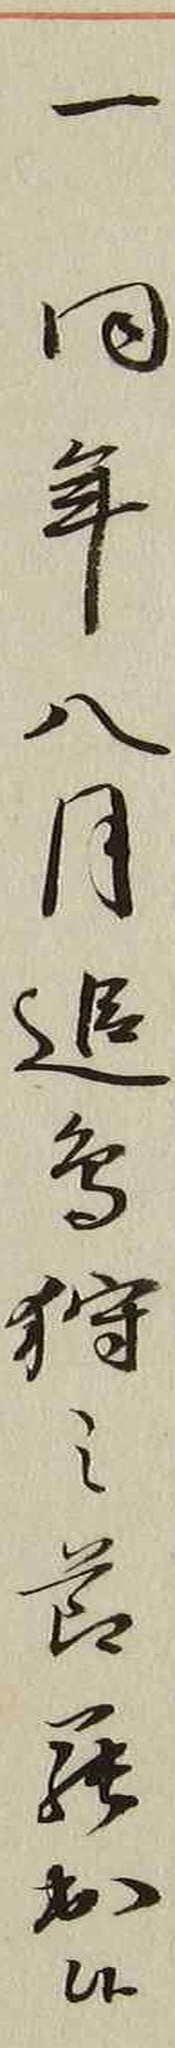一同年八月追鳥狩之節罷出候
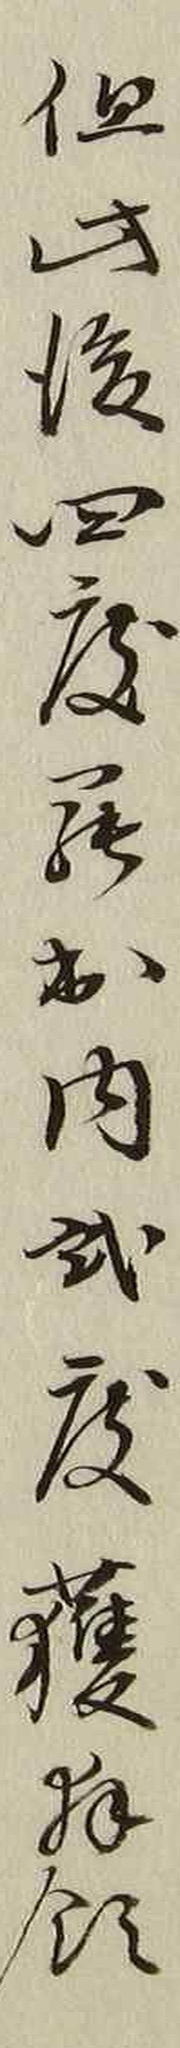但此後四度罷出内弐度獲拝領
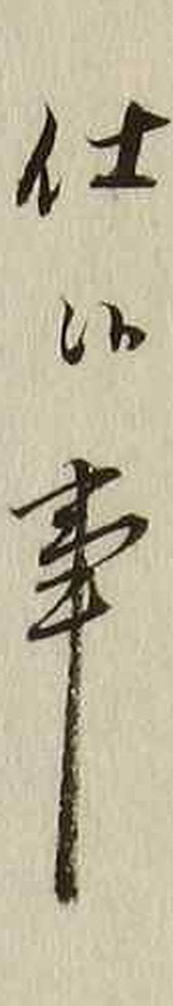仕候事
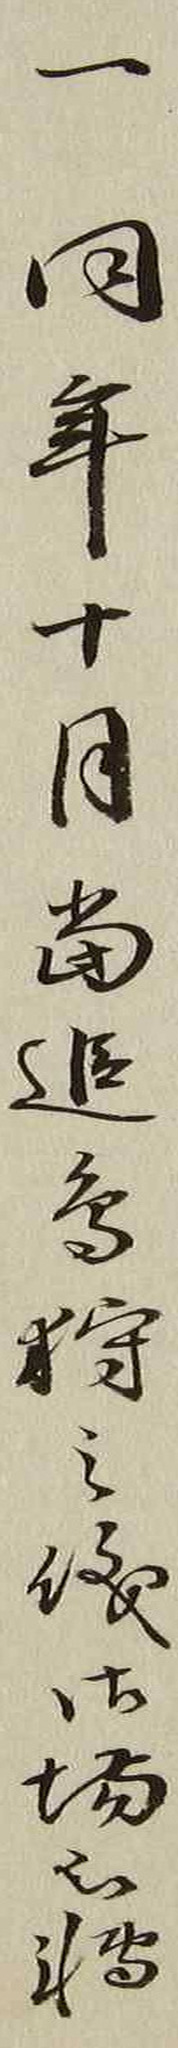一同年十月当追鳥狩之儀御場転
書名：諸士系譜　巻之22　い之部22
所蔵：会津若松市立会津図書館
